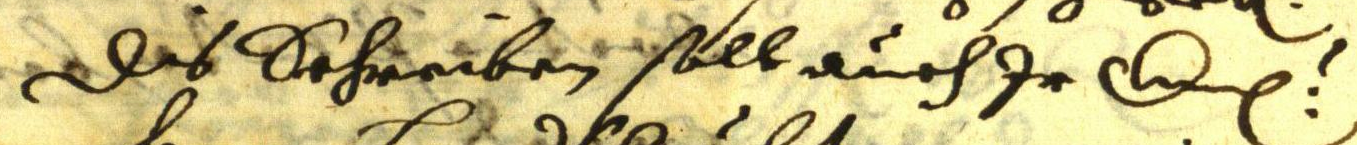Dis Schreiben soll aūch Ir Gn:
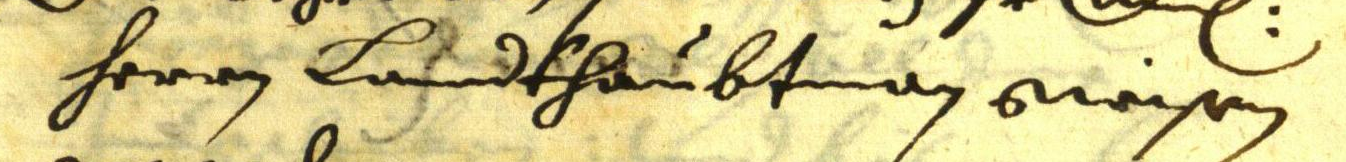herrn Lanndthaūbtman gwisen
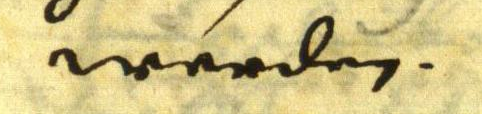werden.
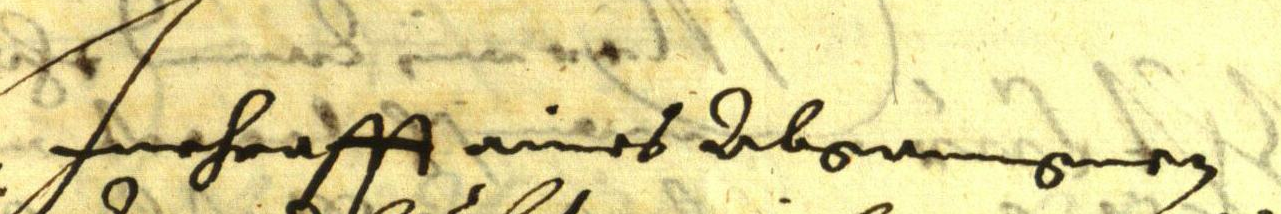Inchrafft aines Abganngnen
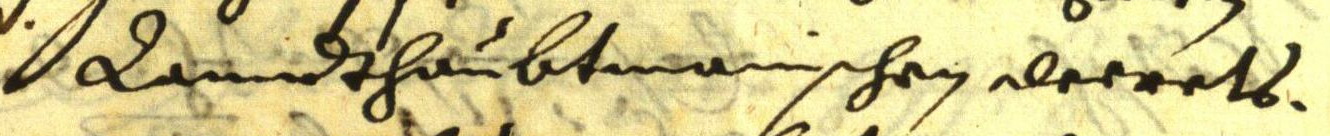Lanndthaūbtmanischen decrets.
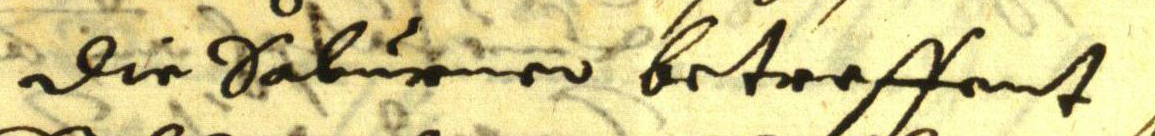die Salūrner betreffent
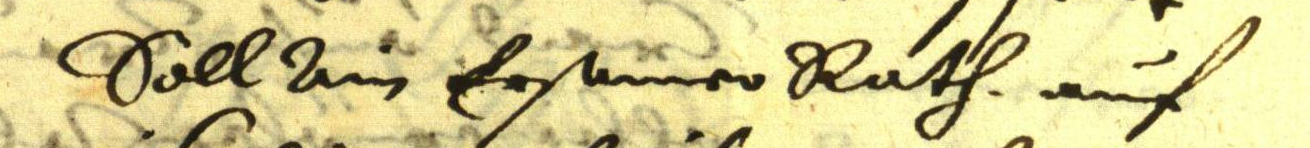Soll Ain Ersamer Rath. aūf
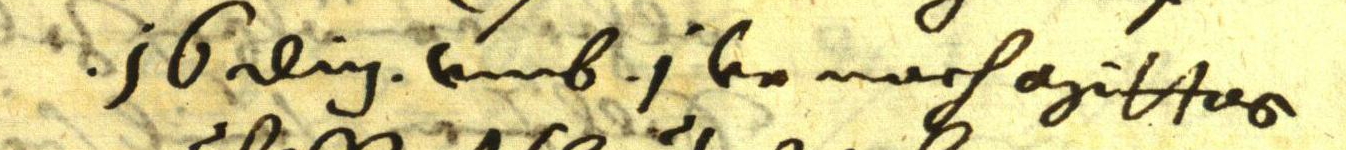.16 diz. vmb .1 vr nach Mittag
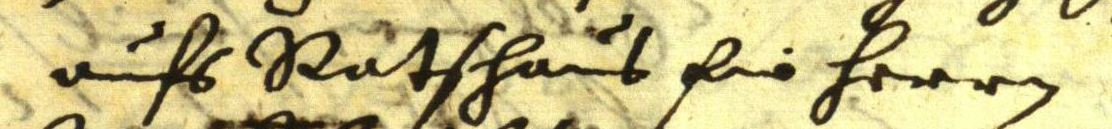aūfs Ratshaūs fir herrn
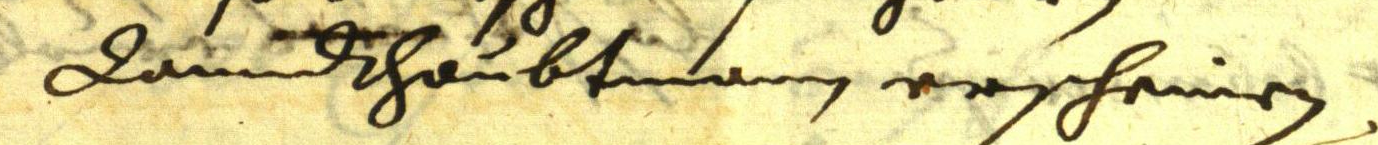Lanndthaūbtmann erscheinen.
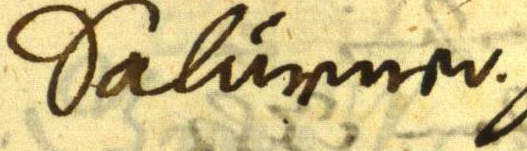Salūrner.
